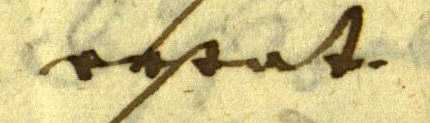erstat.
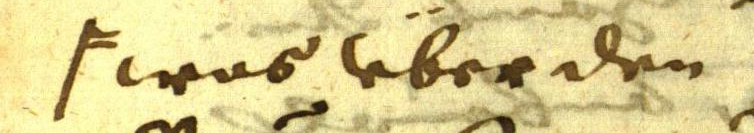was v̈ber den
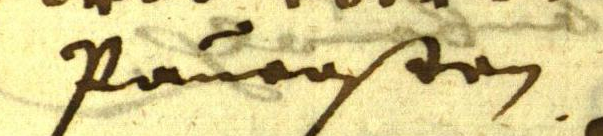Paūcosten
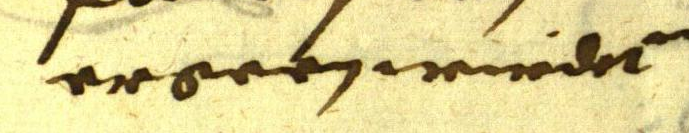ergeen wirdet
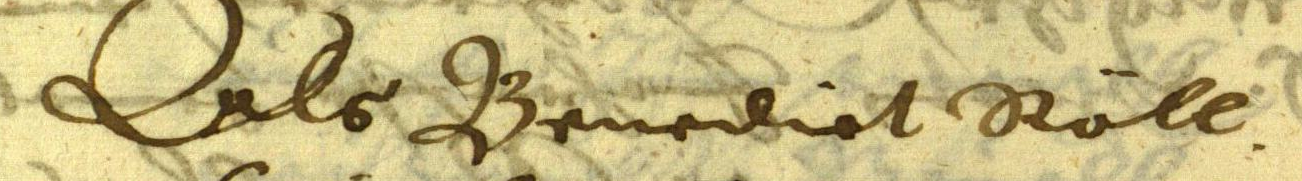Als Benedict Röll
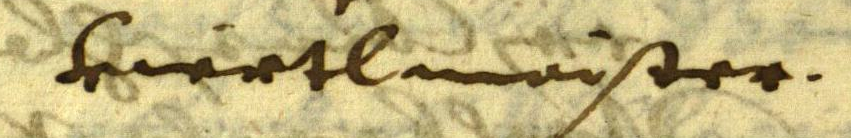Viertlmaister.
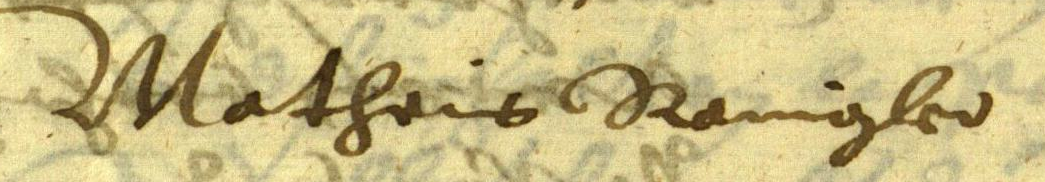Matheis Ranigler
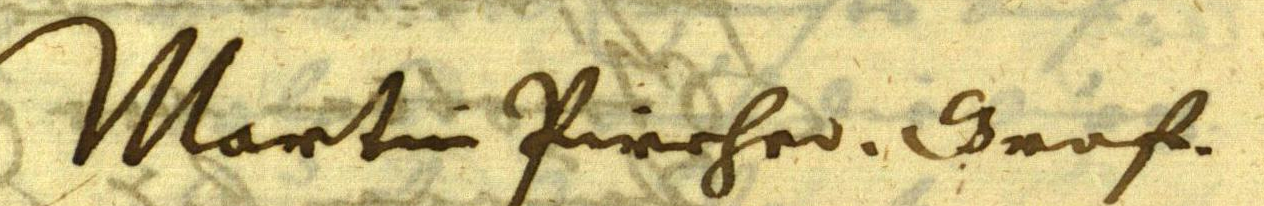Martin Pircher. Graf.
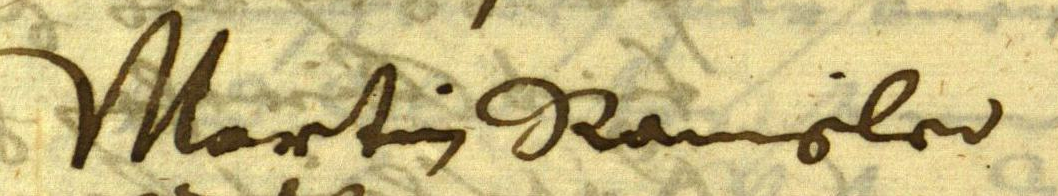Martin Ranigler
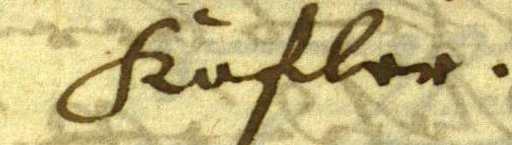Kofler.
